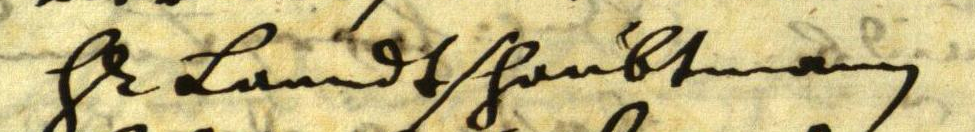hl Lanndtshaūbtmann
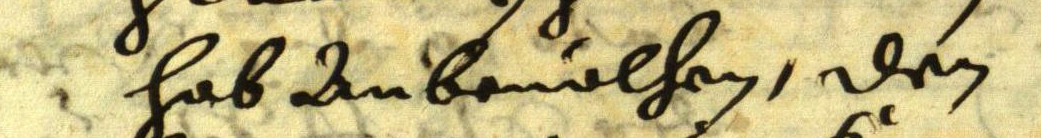hab Anbeūolhen, den
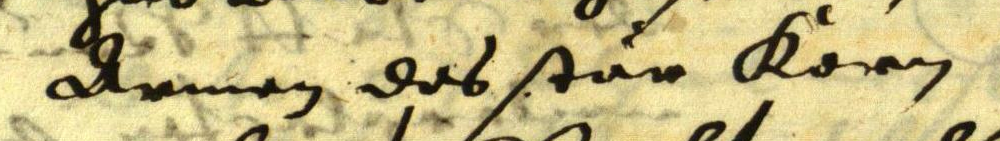Armen das stār Korn
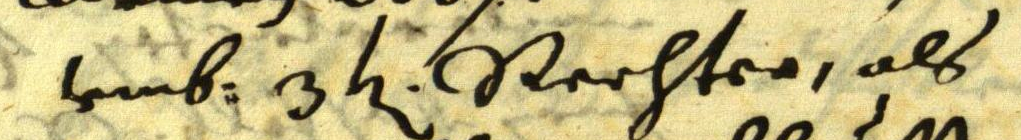umb: 3 k. Rechter, als
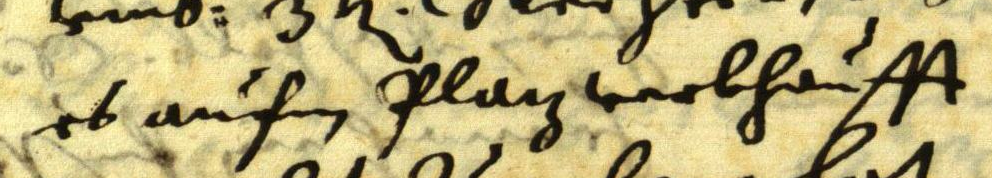es aūfm Plaz verkhaūfft
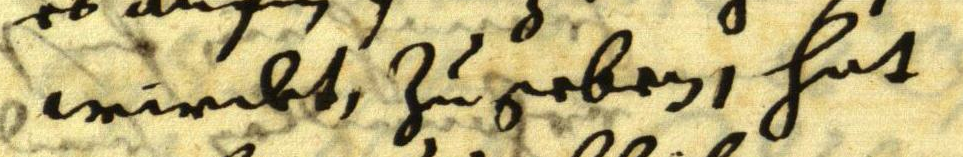wirdet, Zū geben, hat
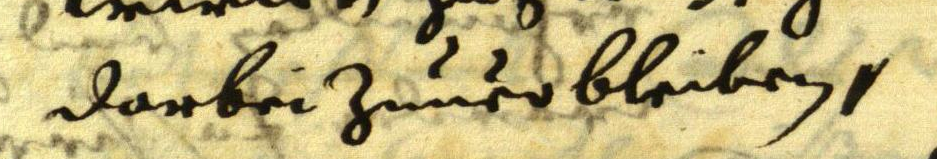darbei Zūūerbleiben,
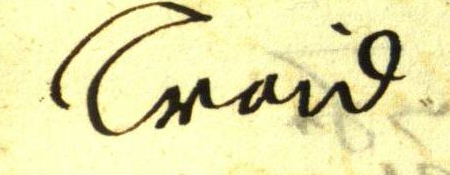Traid
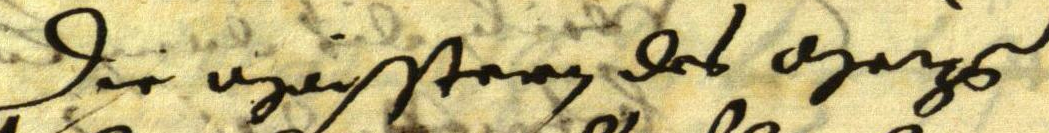Die Maisstern des Mezg
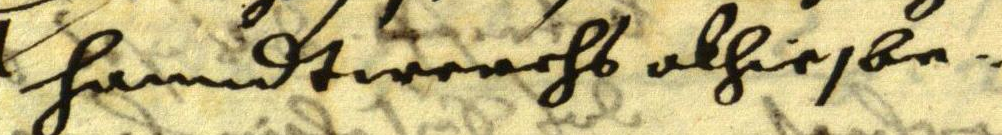Hanndtwerchs alhie, be¬
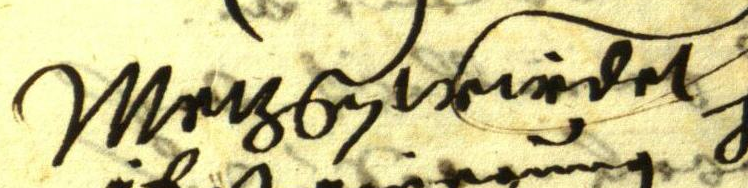Mezgn wirdet
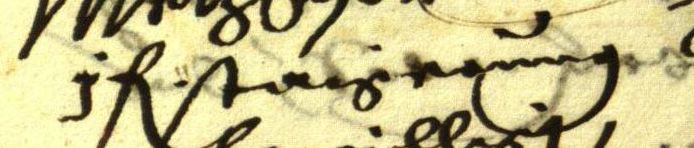1 fl. staigerūng
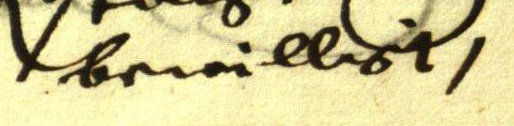bewilligt,
